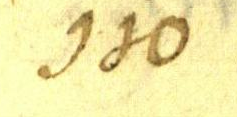110
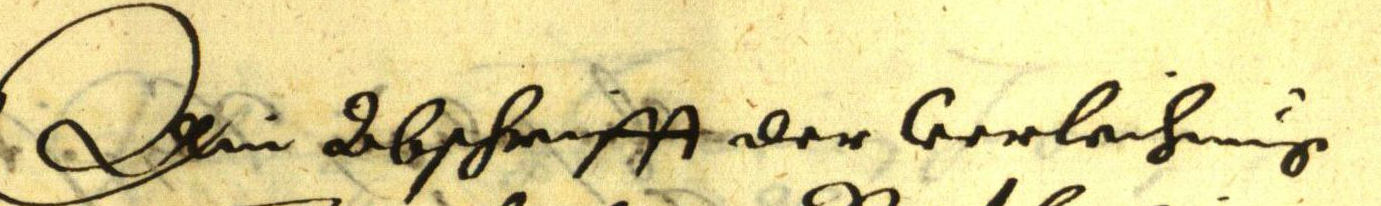Ain Abschrifft der verleihūng
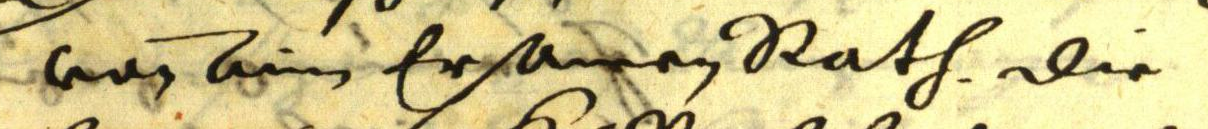von Aim Ersamen Rath. die
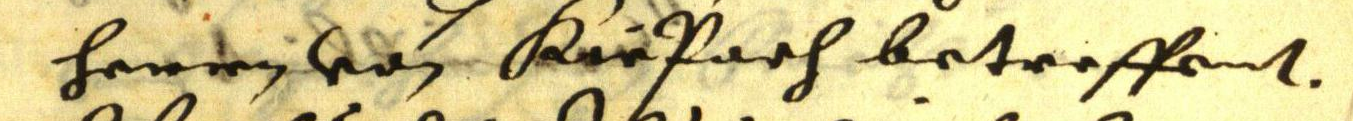herrn von KiePach betreffent.
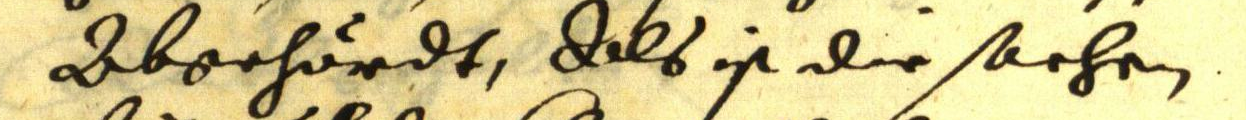Abgehōrdt, Als ist die sachen
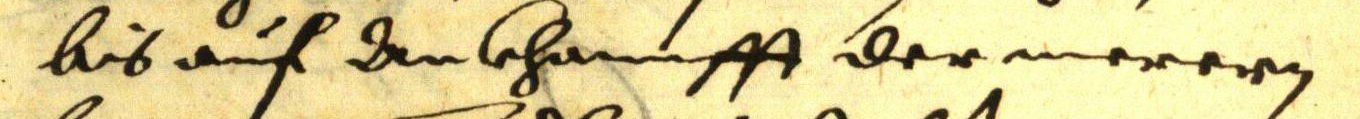bis aūf Ankhonnfft der merern
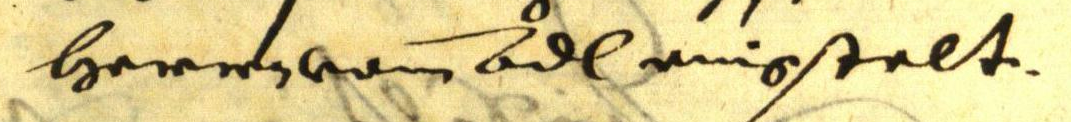herrn vom Adl eingstelt.
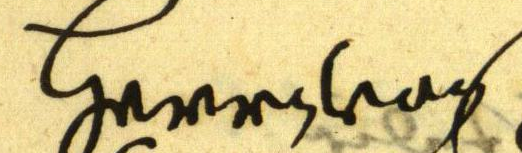Herrn von
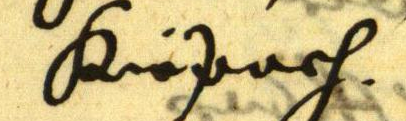KiePach.
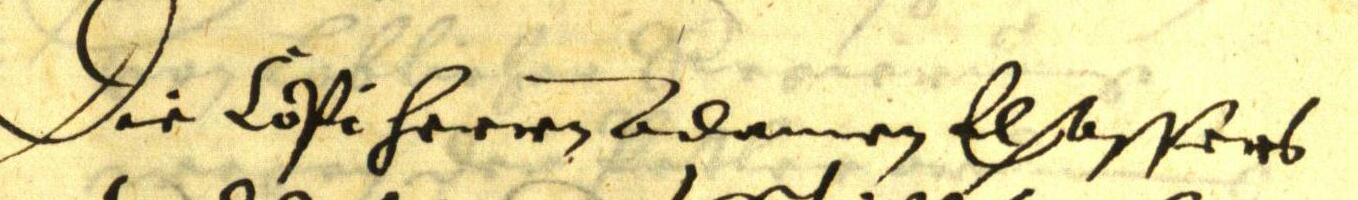Die CoPi herrn Adamen Elsassers
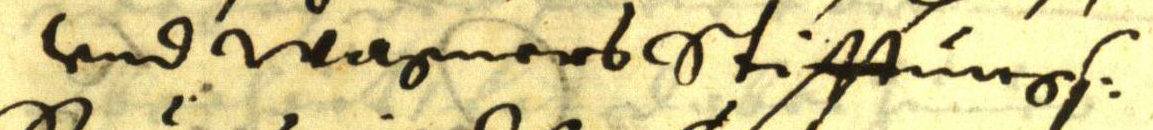vnd Wagners Stifftūngs¬
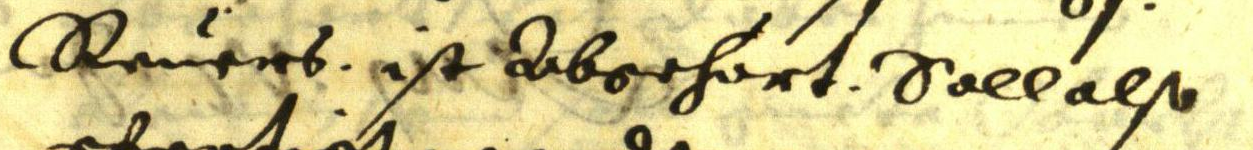Reūers. ist Abgehōrt. Soll also
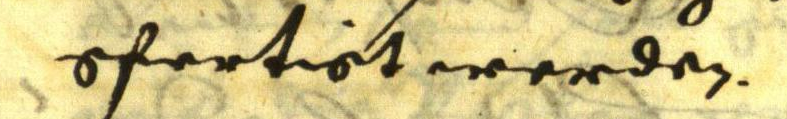gfertigt werden.
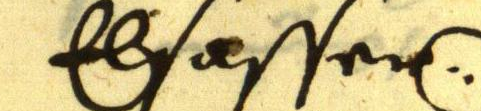Elsasser¬
